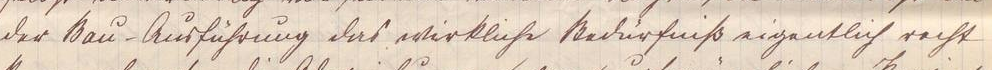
der Bau-Ausführung das wirkliche Bedürfniß eigentlich recht
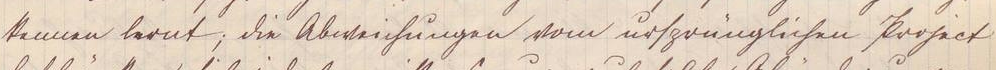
kennen lernt; die Abweichungen vom ursprünglichen Project
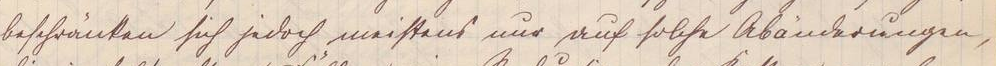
beschränken sich jedoch meistens nur auf solche Abänderungen,
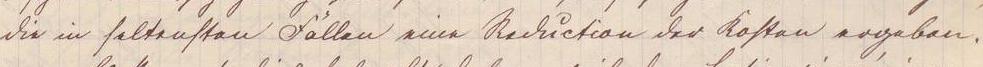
die in seltensten Fällen eine Reduction der Kosten ergeben.
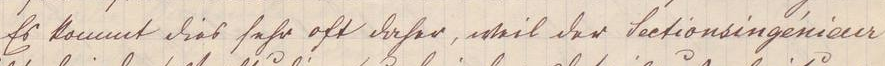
Es kommt dies sehr oft daher, weil der Sectionsingénieur
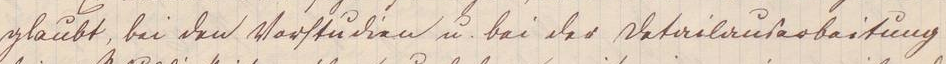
glaubt, bei den Vorstudien u. bei der Detailausarbeitung
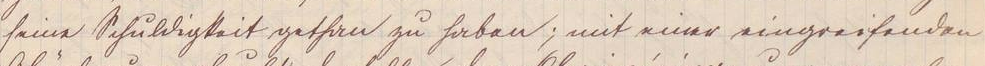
seine Schuldigkeit gethan zu haben; mit einer eingreifenden
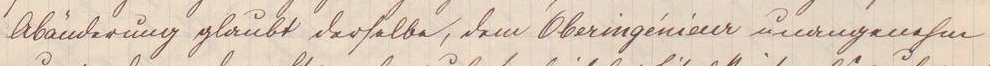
Abänderung glaubt derselbe, dem Oberingénieur unangenehm
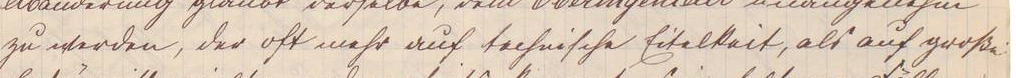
zu werden, der oft mehr auf technische Eitelkeit, als auf große
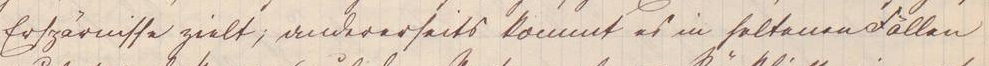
Erspärnisse zielt; andererseits kommt es in seltenen Fällen
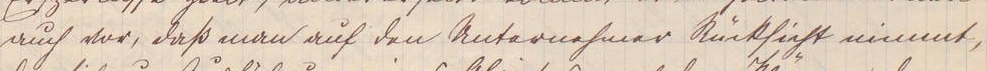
auch vor, daß man auf den Unternehmer Rücksicht nimmt,
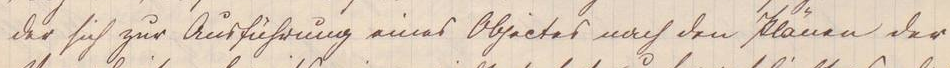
der sich zur Ausführung eines Objectes nach den Plänen der
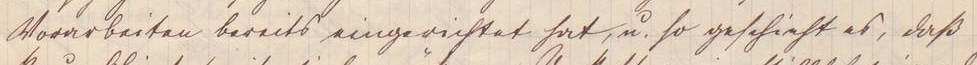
Vorarbeiten bereits eingerichtet hat, u. so geschieht es, daß
